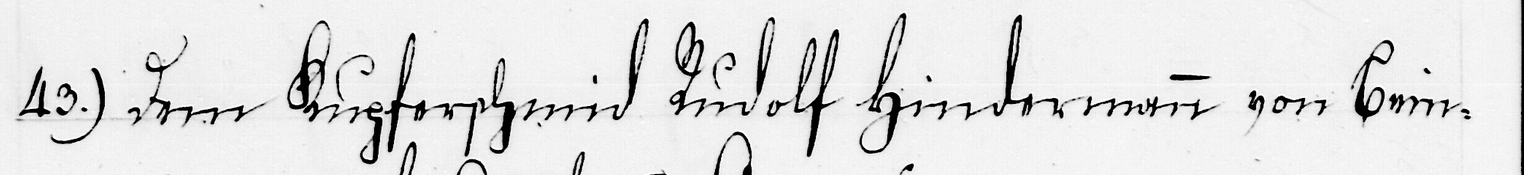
43.) Dem Kupferschmid Rudolf Hindermann von Bein¬
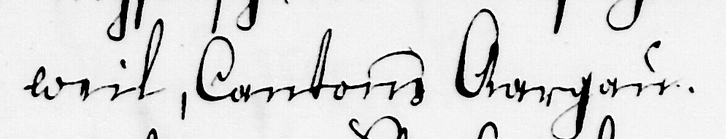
weil, Cantons Aargau.
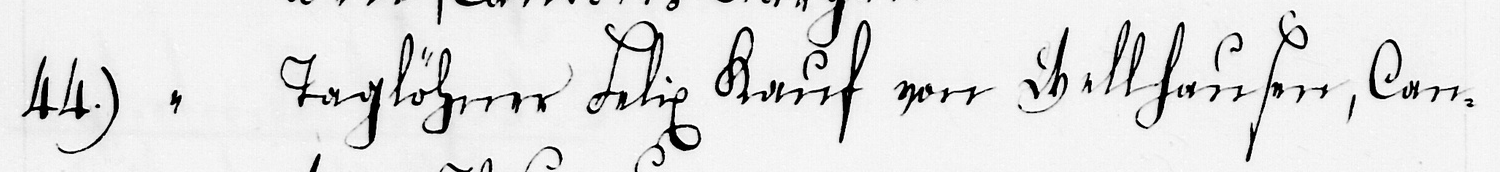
44.) “ Taglöhner Felix Kauf von Wellhausen, Can¬
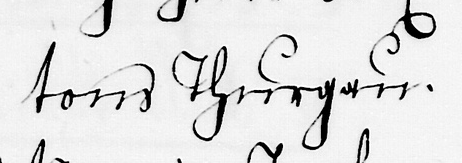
tons Thurgau.
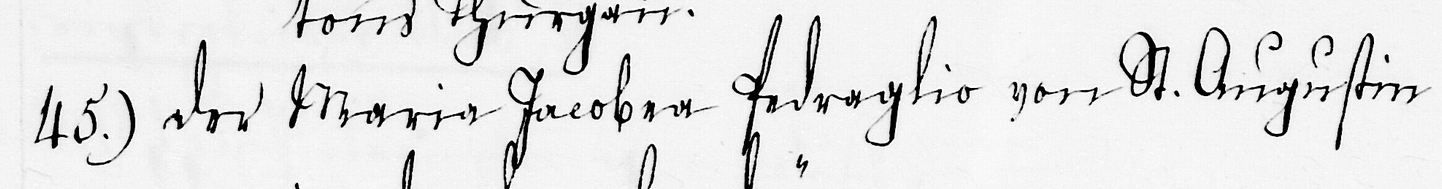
45.) der Maria Jacobea Pedraglio von St. Augustin
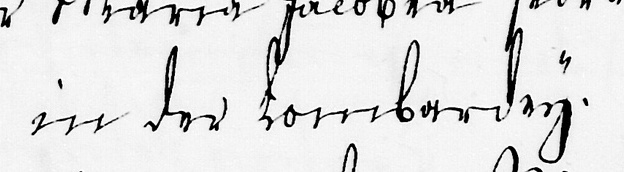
in der Lombardey.
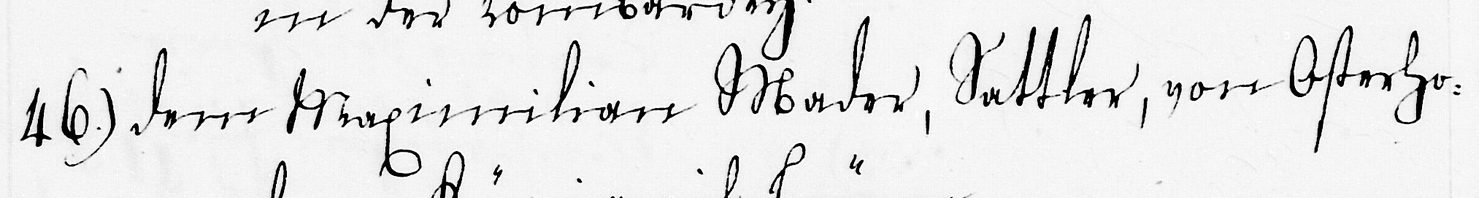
46.) dem Maximilian Mader, Sattler, von Osterho¬
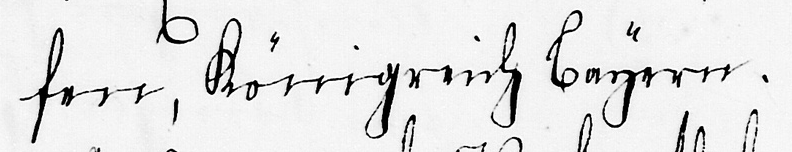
fen, Königreich Bayern.
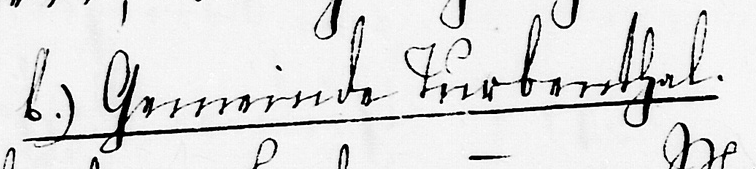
b.) Gemeinde Turbenthal.
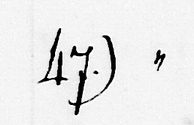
47.)
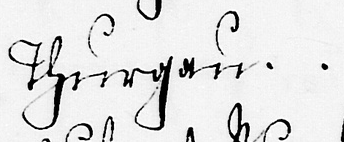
Thurgau.
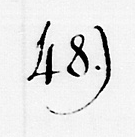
48.)
